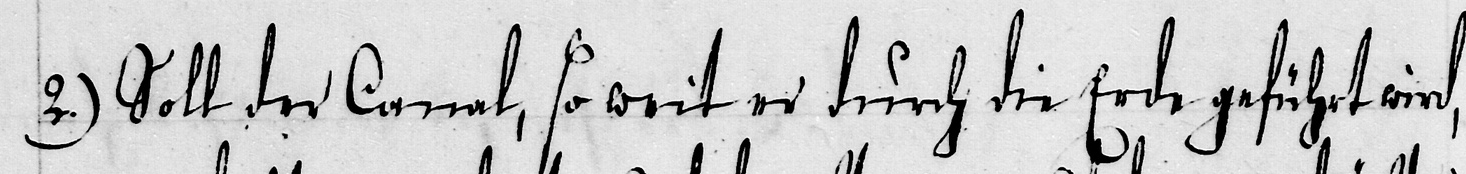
2.) Soll der Canal, so weit er durch die Erde geführt wir¬
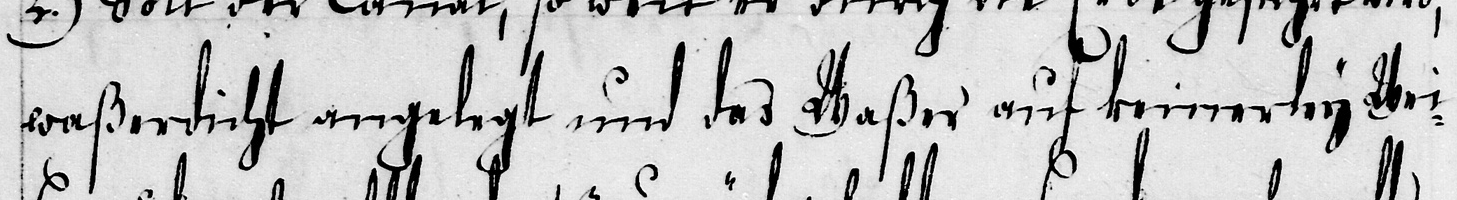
waßerdicht angelegt und das Waßer auf keinerley Wei¬
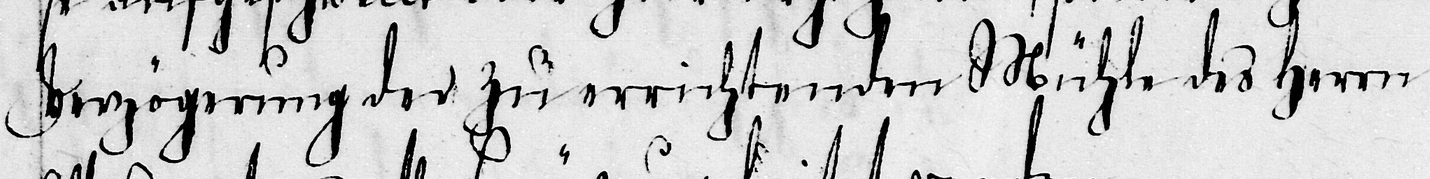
Verzögerung der zu errichtenden Mühle des Herrn
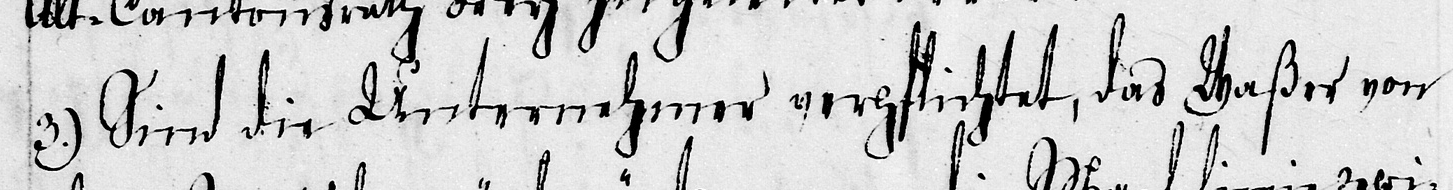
3.) Sind die Unternehmer verpflichtet, das Waßer von
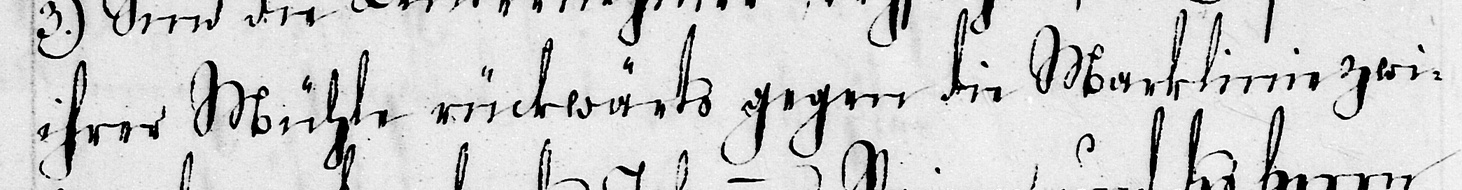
ihrer Mühle rückwärts gegen die Marklinie zwi¬
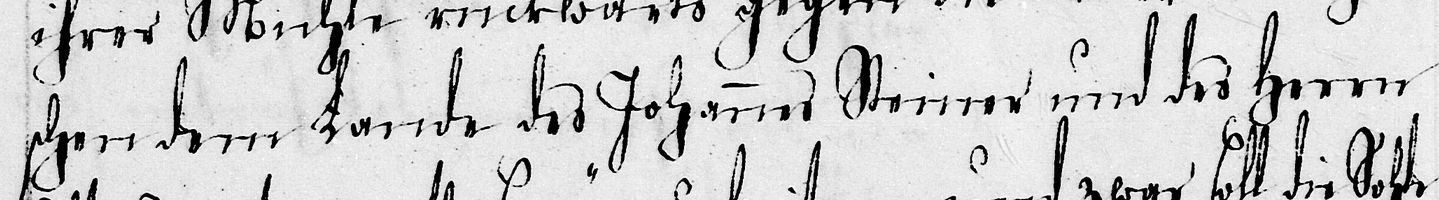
schen dem Lande des Johannes Steiner und des Herrn
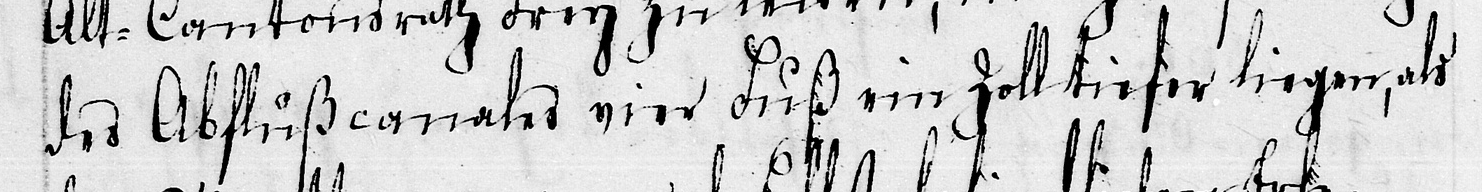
des Abflußcanales vier Fuß ein Zoll tiefer liegen, als
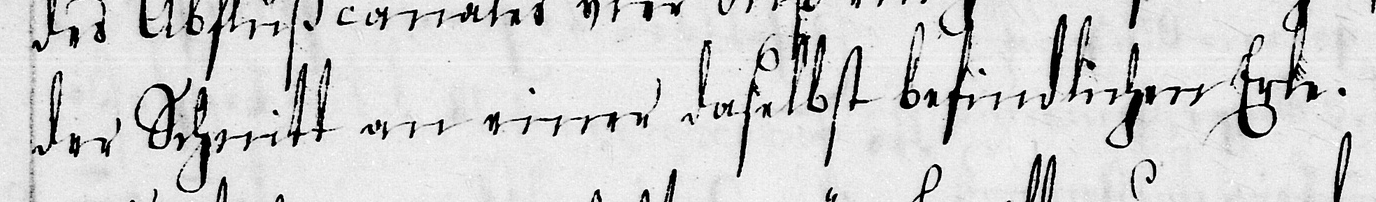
der Schnitt an einer daselbst befindlichen Erle.
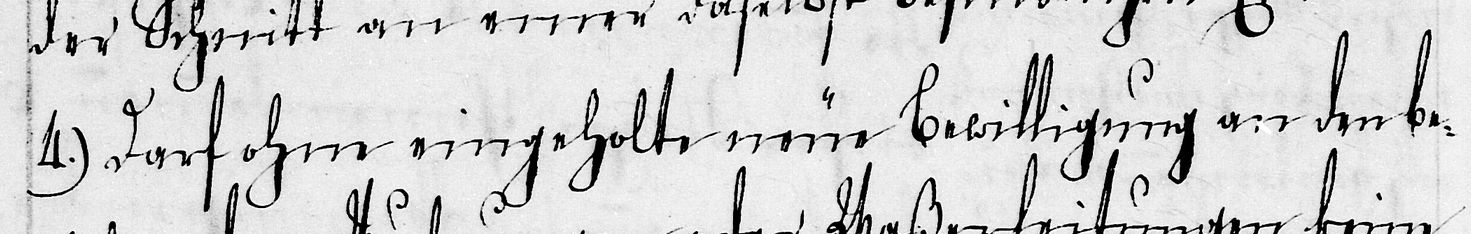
4.) Darf ohne eingeholte neue Bewilligung an den be¬
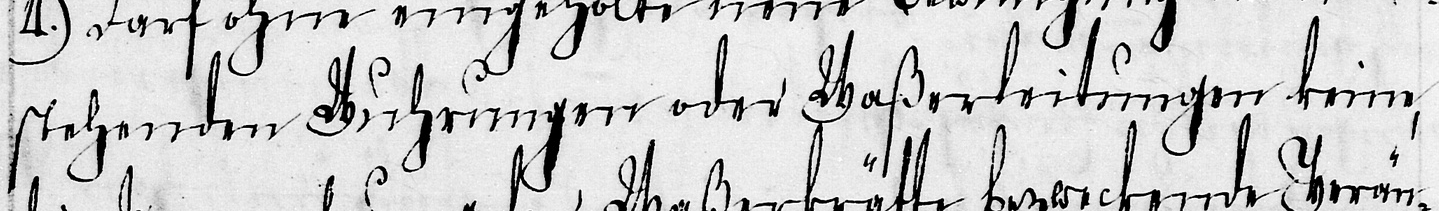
stehenden Wuhrungen oder Waßerleitungen keine
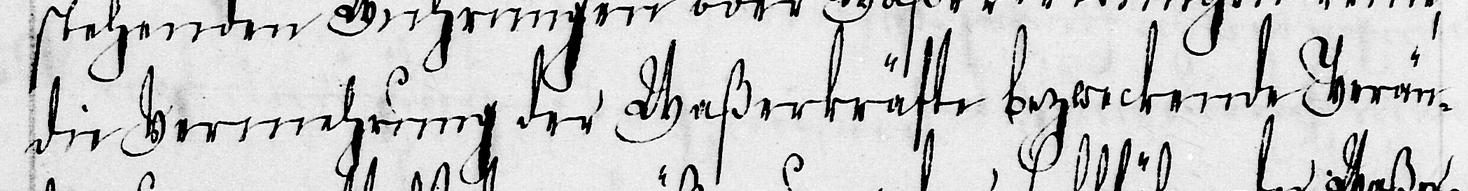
die Vermehrung der Waßerkräfte bezweckende Verän¬
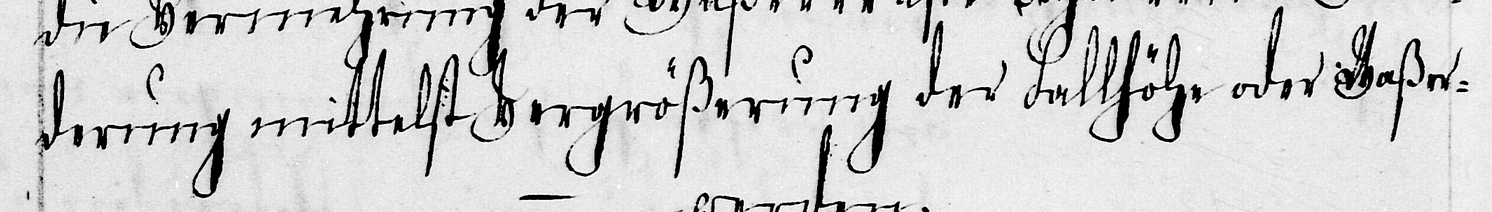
derung mittelst Vergrößerung der Fallhöhe oder Waßer¬
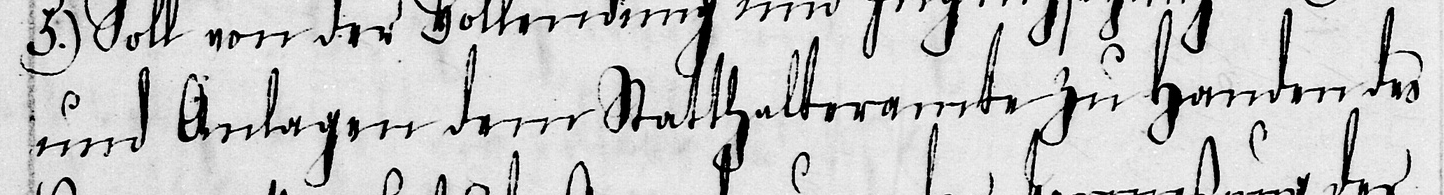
und Anlagen dem Statthalteramte zu Handen des
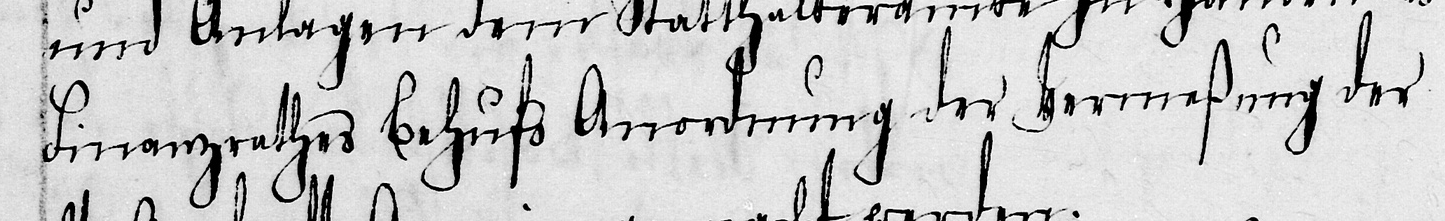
Finanzrathes Behufs Anordnung der Vermeßung der
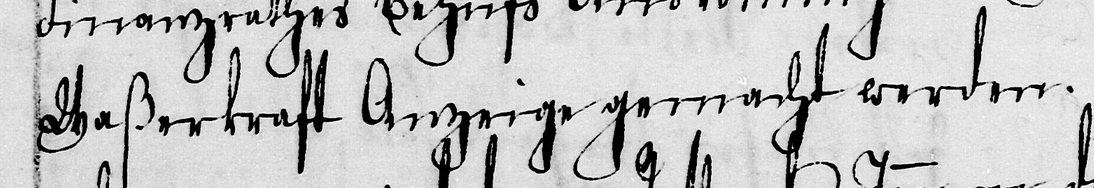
Waßerkraft Anzeige gemacht werden.
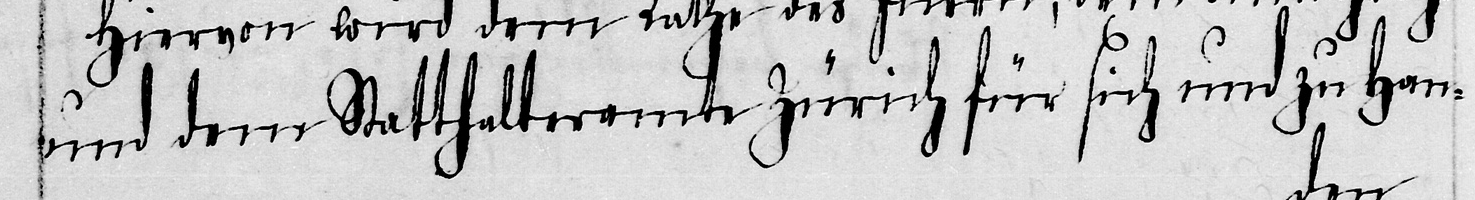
und dem Statthalteramte Zürich für sich und zu Han-
